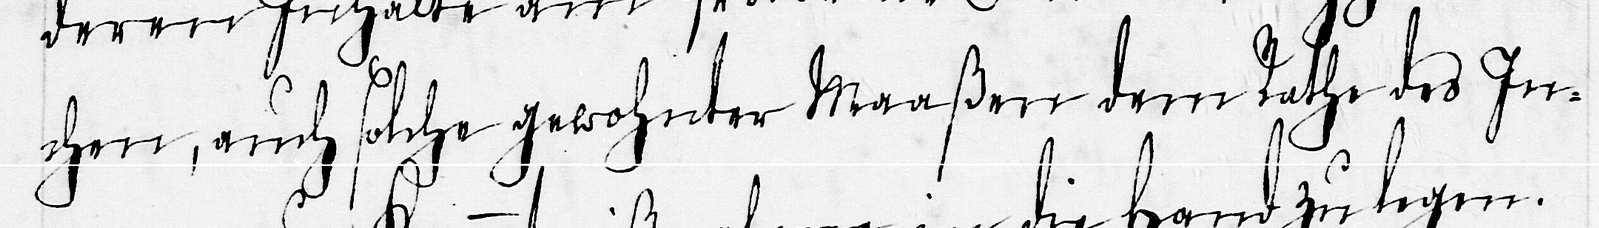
chen, auch solche gewohnter Maaßen dem Rathe des In¬
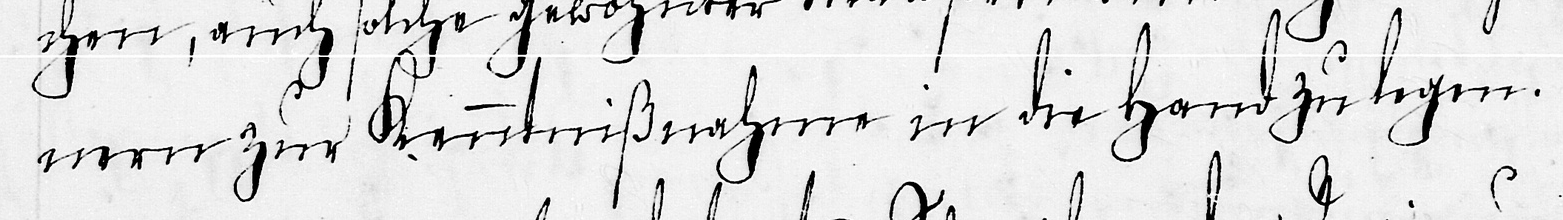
nern zur Kenntnißnahme in die Hand zu legen.
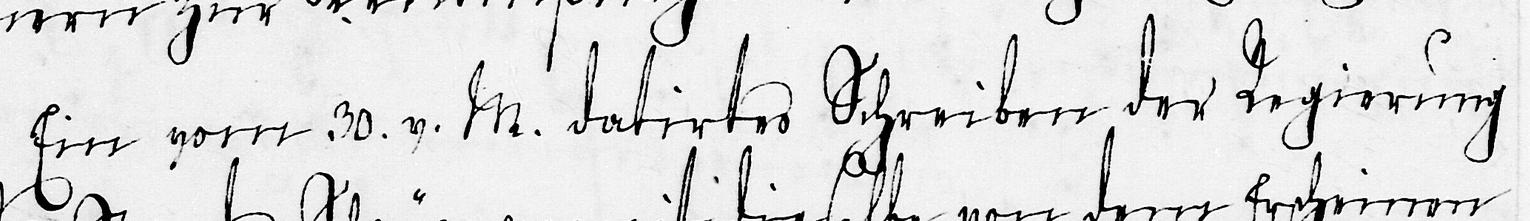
Ein vom 30. v. M. datirtes Schreiben der Regierung
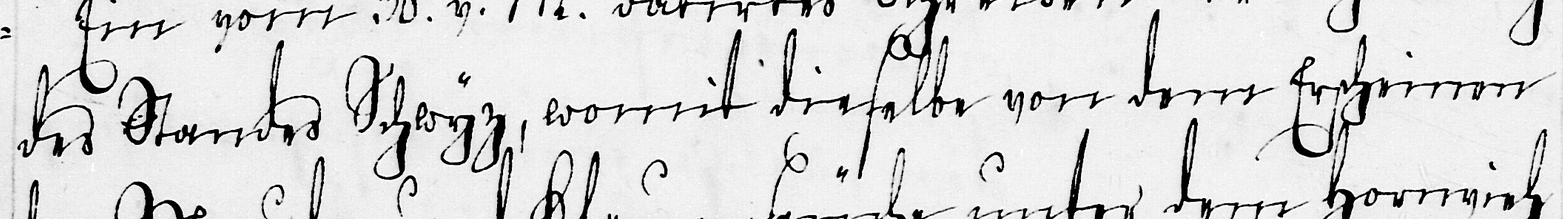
des Standes Schwyz, womit dieselbe von dem Erscheinen
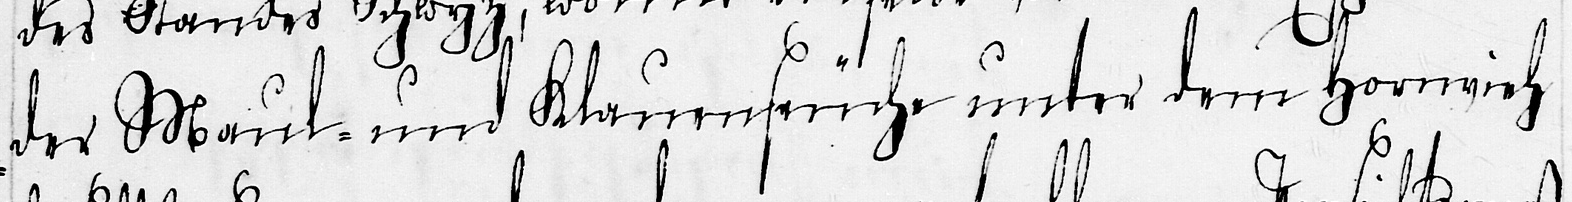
der Maul- und Klauenseuche unter dem Hornvieh
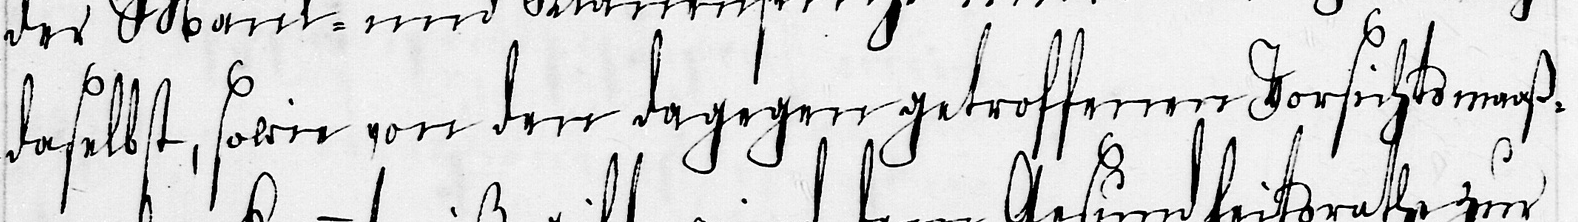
daselbst, sowie von den dagegen getroffenen Vorsichtsmaaß¬
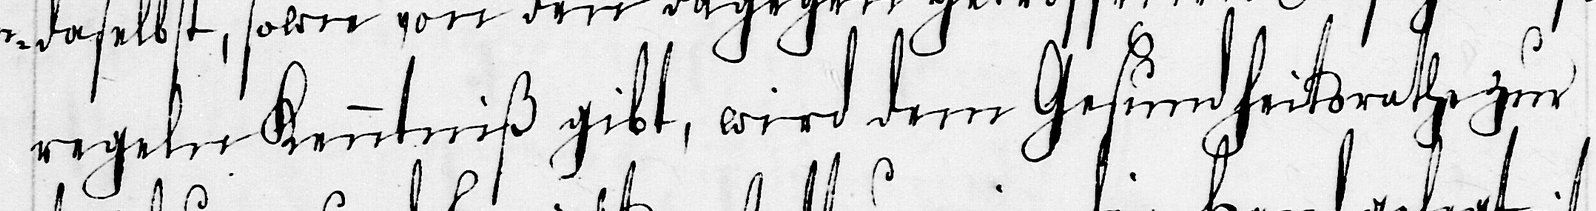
regeln Kenntniß gibt, wird dem Gesundheitsrathe zur
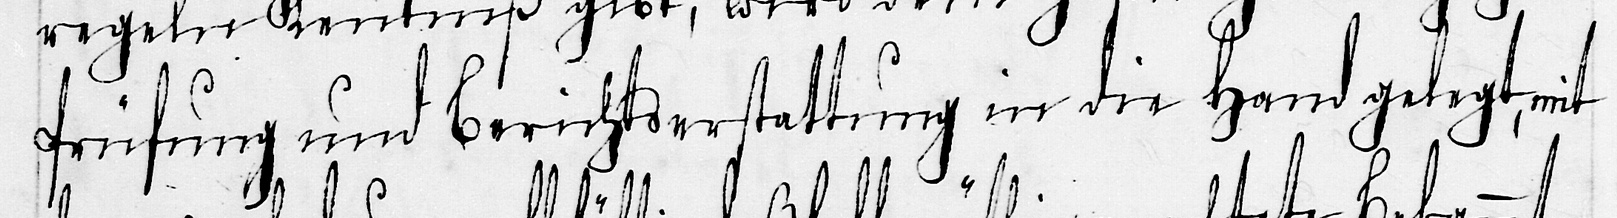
Prüfung und Berichtserstattung in die Hand gelegt, mit
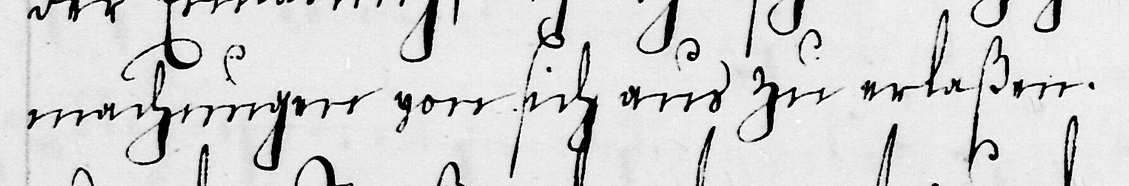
tmachungen von sich aus zu erlaßen.
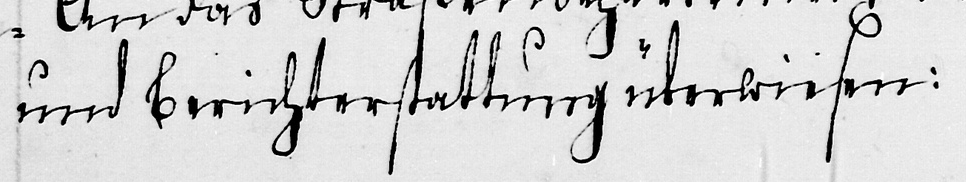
und Berichterstattung überwiesen:
